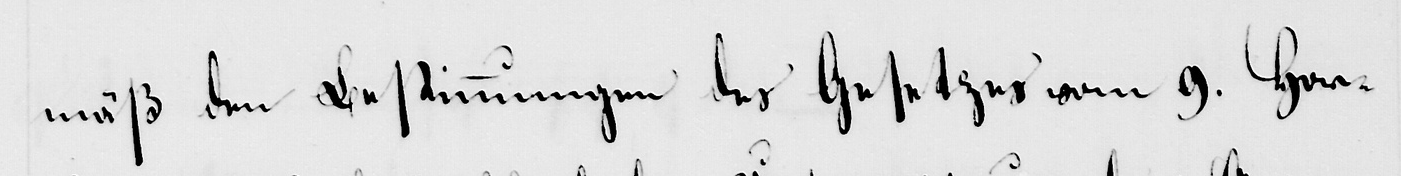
mäß der Bestimmungen des Gesetzes vom 9. Horn¬
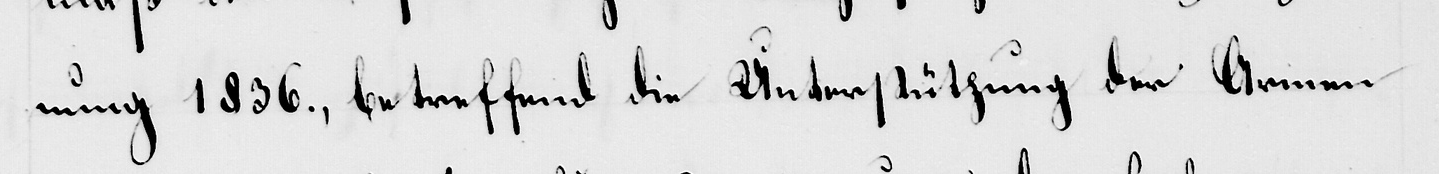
ung 1836., betreffend die Unterstützung der Armen
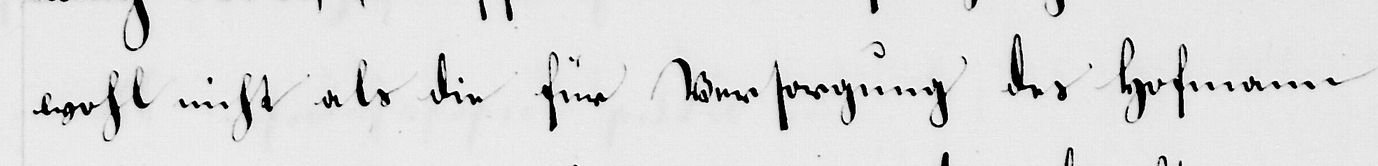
wohl nicht als die für Versorgung des Hofmann
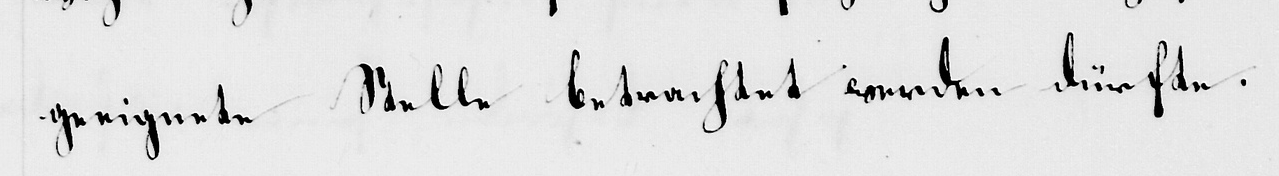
geeignete Stelle betrachtet werden dürfte.
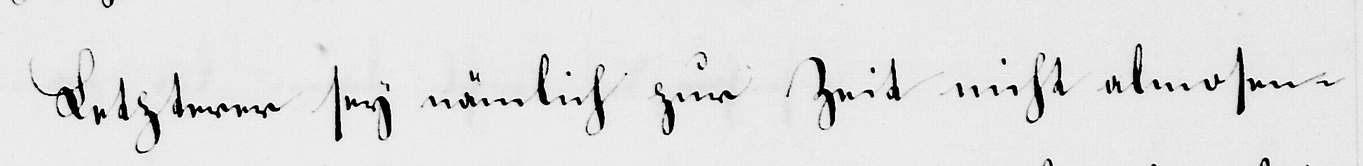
Letzterer sey nämlich zur Zeit nicht almosen¬
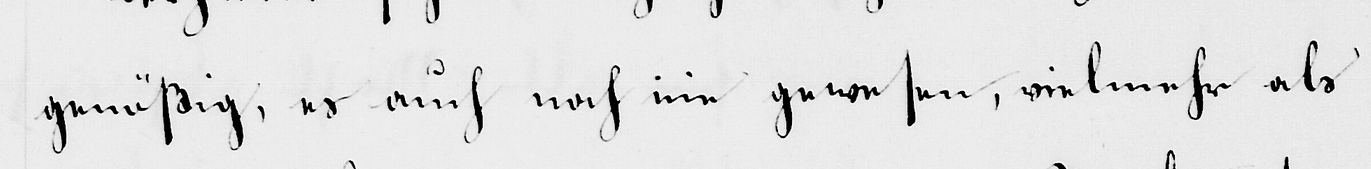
genößig, es auch noch nie gewesen, vielmehr als
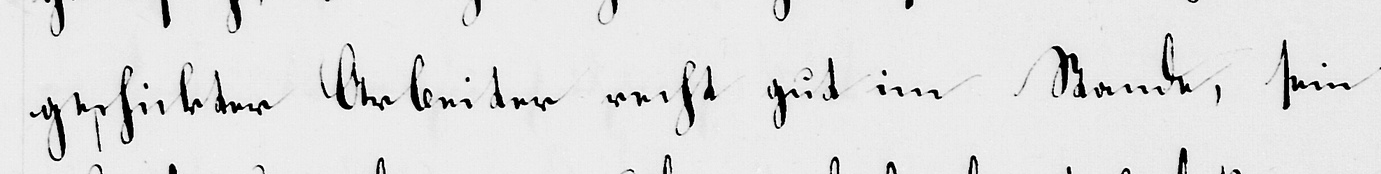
geschickter Arbeiter recht gut im Stande, sein
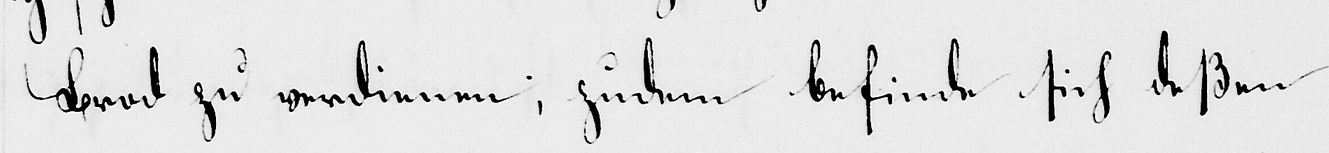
Brod zu verdienen; zudem befinde sich deßen
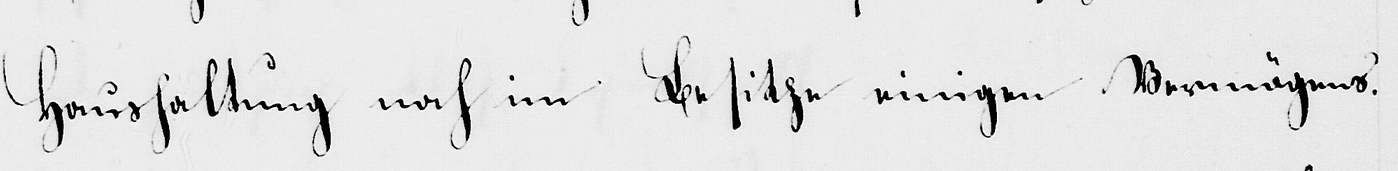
Haushaltung noch im Besitze einigen Vermögens.
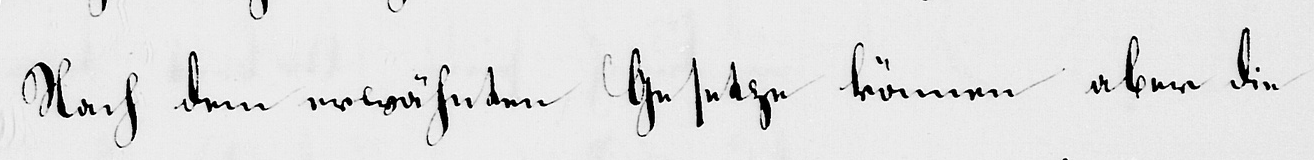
Nach dem erwähnten Gesetze können aber die
